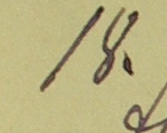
18
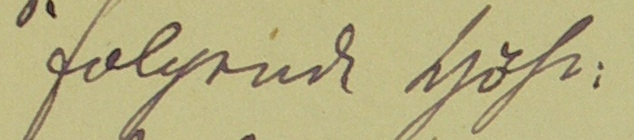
folgender Höhe
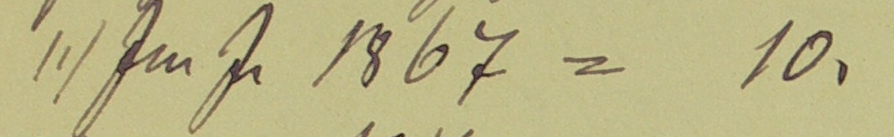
1) Im Jahr 1867 = 10
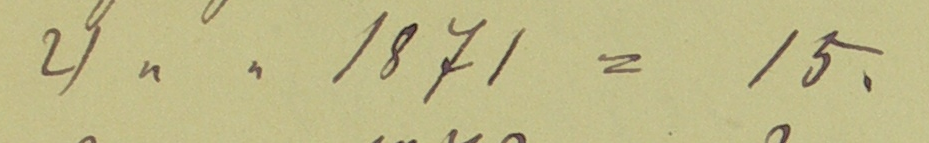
2) * 1871 = 15
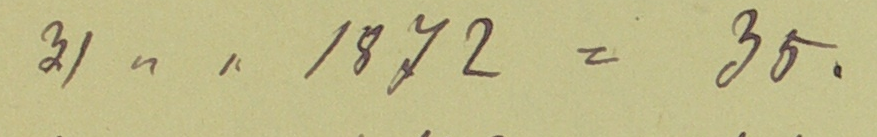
3) * 1872 = 35
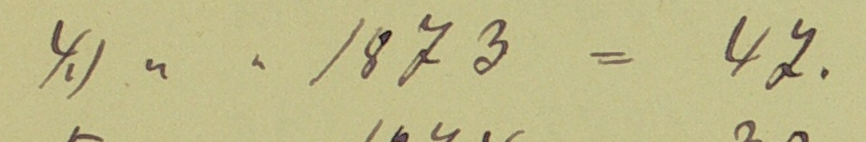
4) * 1873 = 47
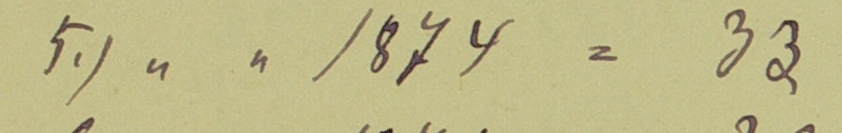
5) * 1874 = 33
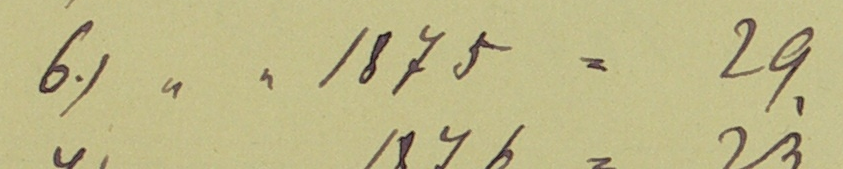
6) * 1875 = 29
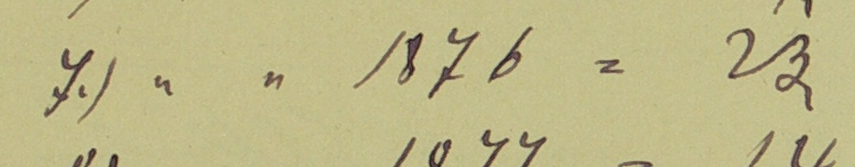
7) * 1876 = 23
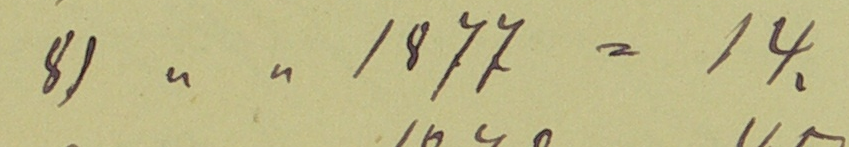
8) * 1877 = 14
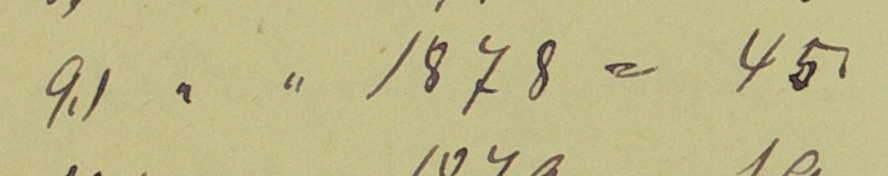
9) * 1878 = 45
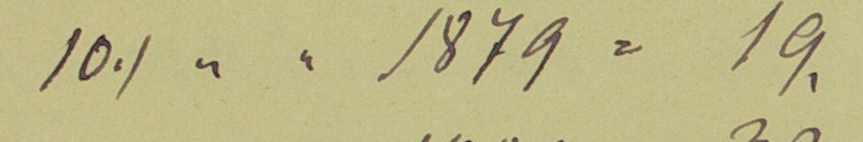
10) * 1879 = 19
